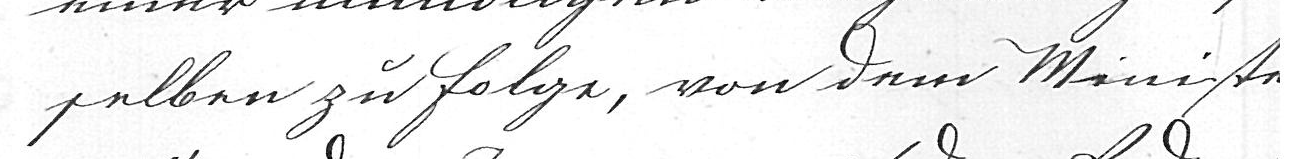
selben zu Folge, von den Minister-
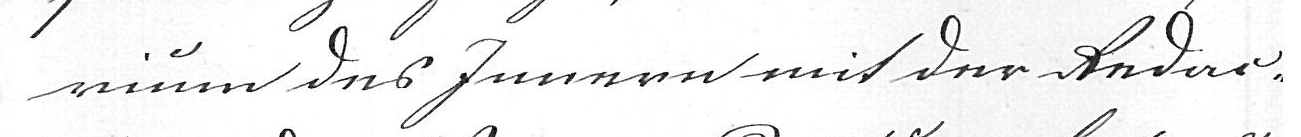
ium des Innern mit der Redac-
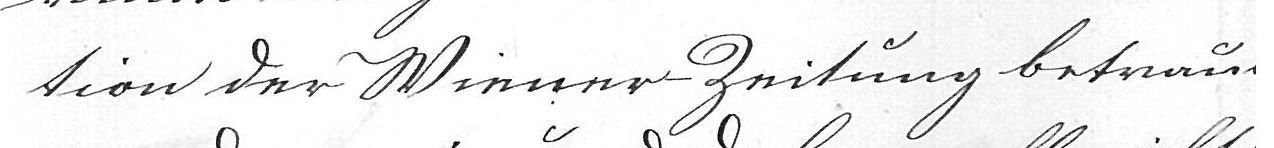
tion der Wiener Zeitung betraut
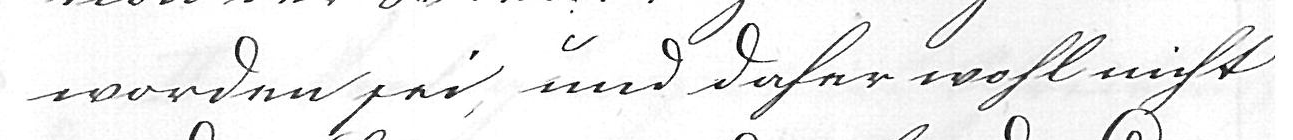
worden sei und daher wohl nicht
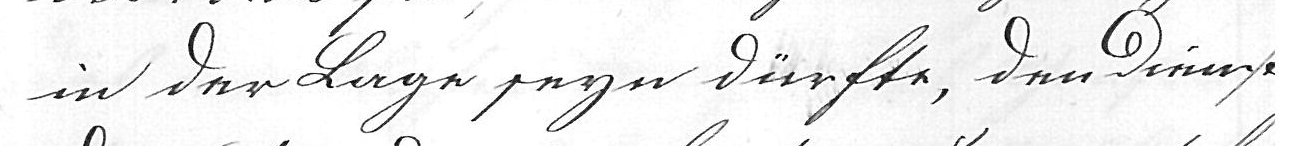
in der Lage seyn dürfte, den Dienst
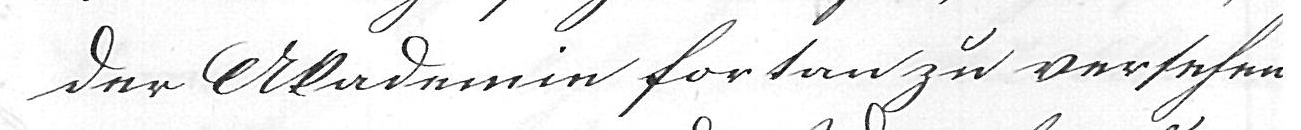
der Akademie fortan zu versehen,
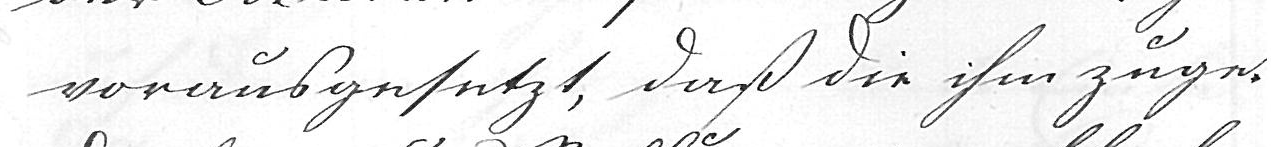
vorausgesetzt, daß die ihm zuge-
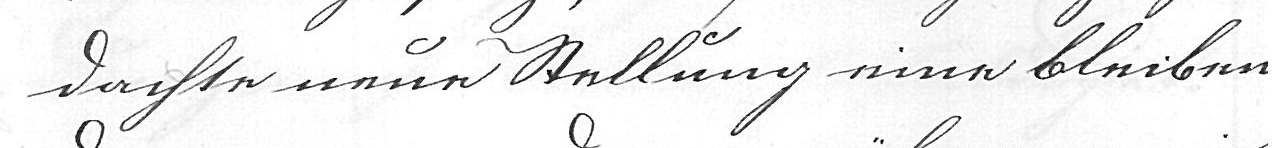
dachte neue Stellung eine bleiben-
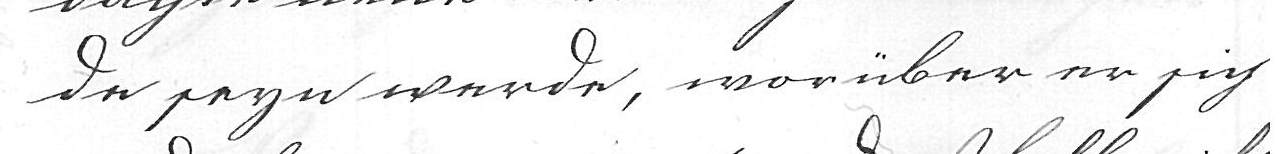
de seyn werde, worüber er sich
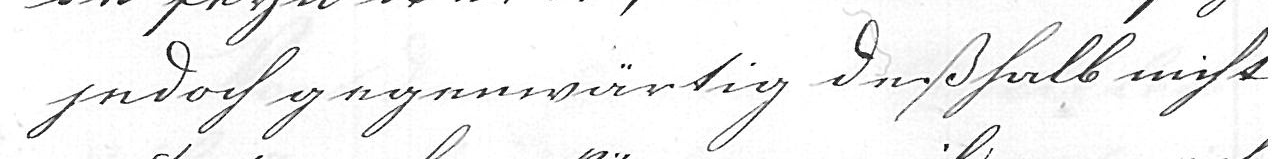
jedoch gegenwärtig deßhalb nicht
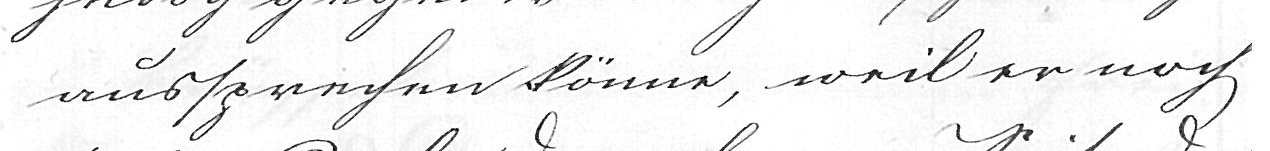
aussprechen könne, weil er noch
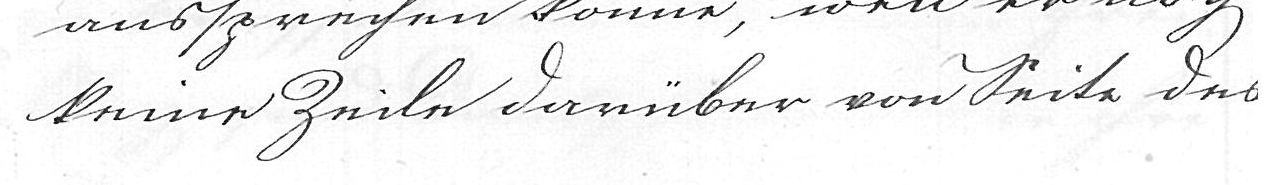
keine Zeile darüber von Seite des
